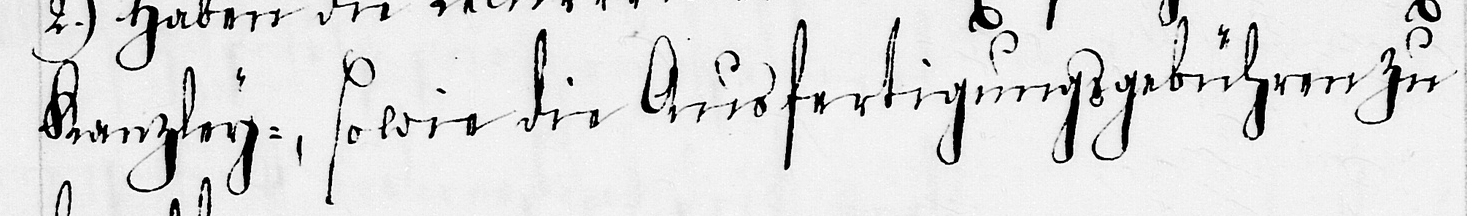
Kanzley-, sowie die Ausfertigungsgebühren zu
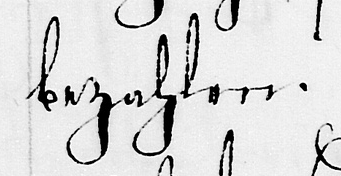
bezahlen.
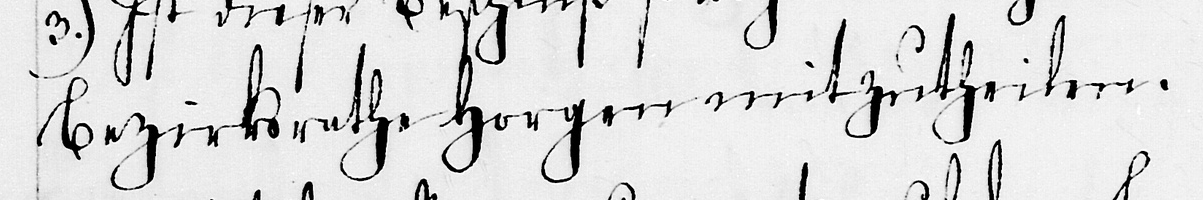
Bezirksrathe Horgen mitzutheilen.
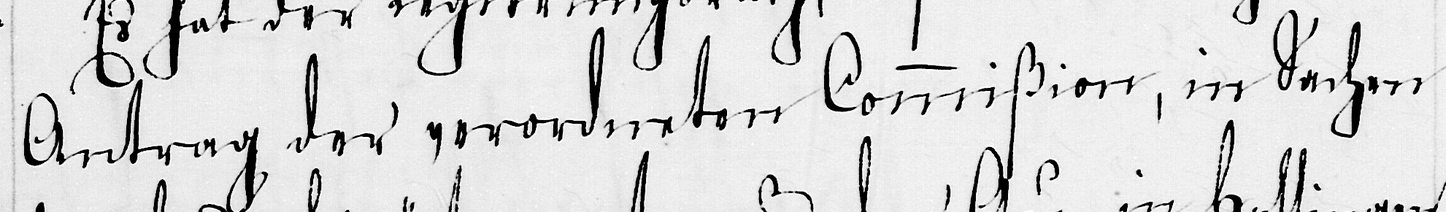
Antrag der verordneten Commißion, in Sachen
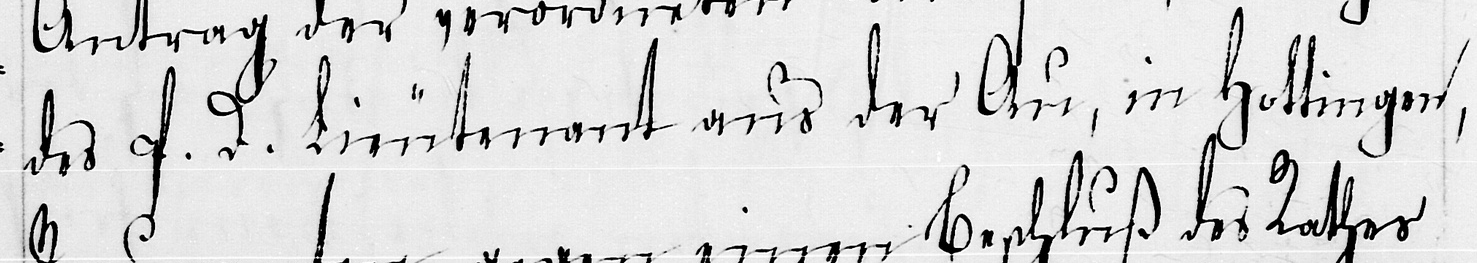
des P. D. Lieutenant aus der Au, in Hottingen,
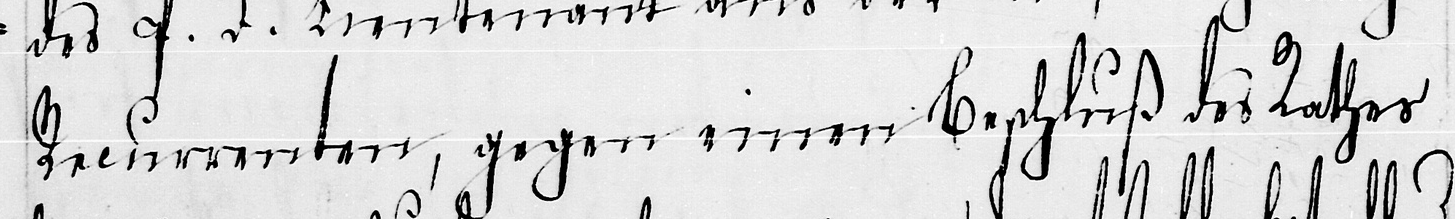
Recurrenten, gegen einen Beschluß des Rathes
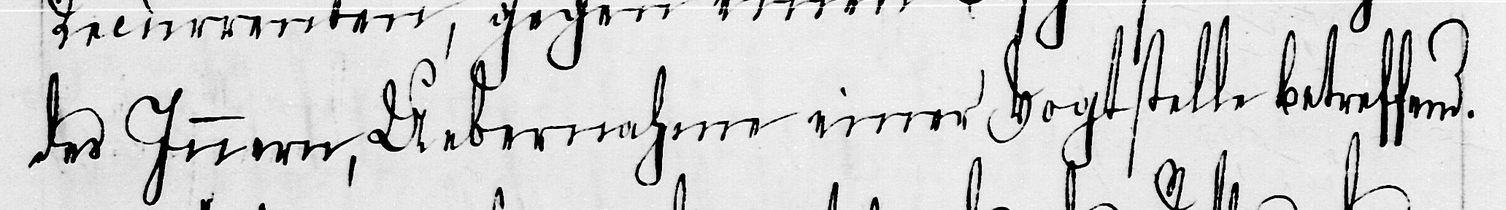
des Innern, Uebernahme einer Vogtstelle betref¬
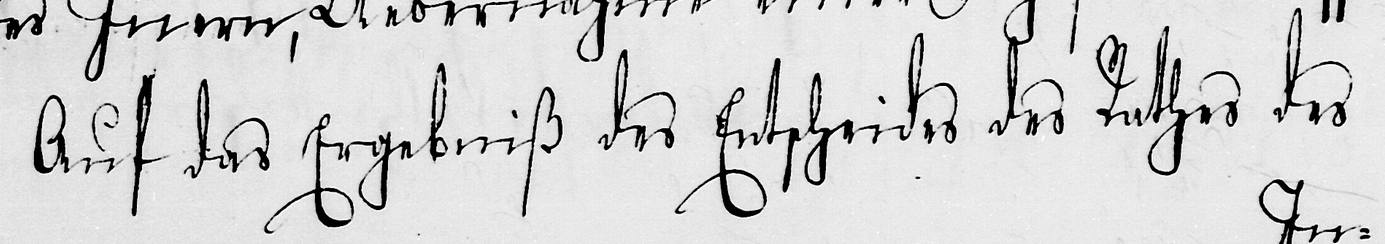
Auf das Ergebniß des Entscheides des Rathes des
